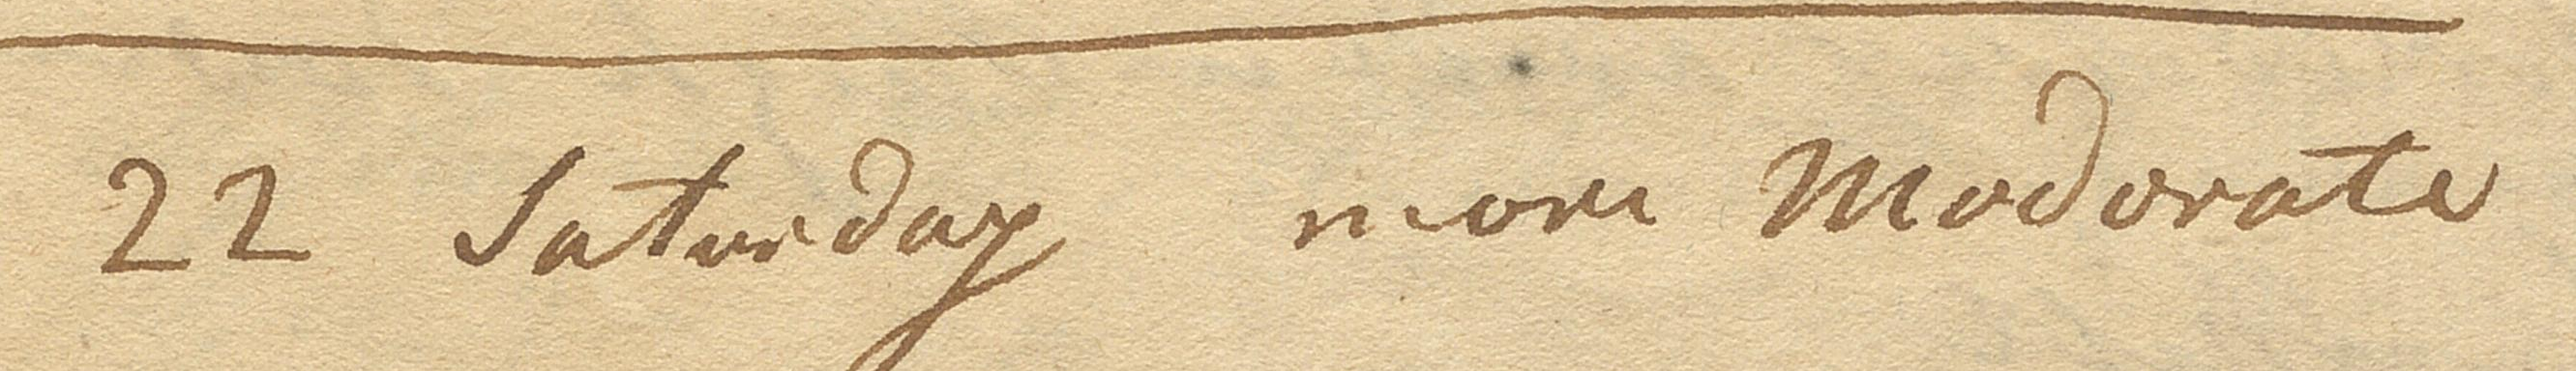22 Saturday more Modorate
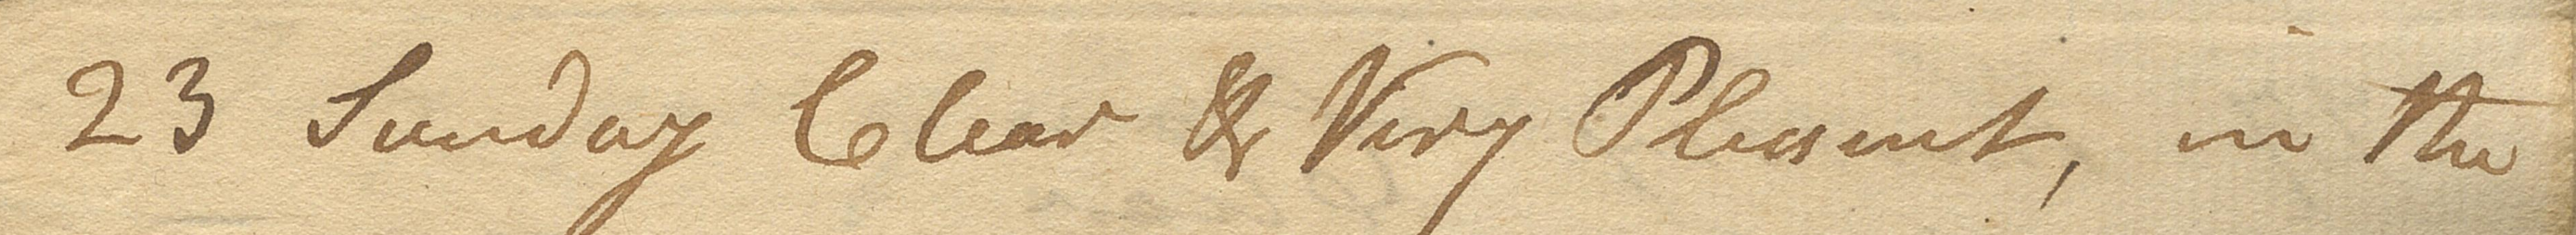23 Sunday Clear & Very Pleasent, in the
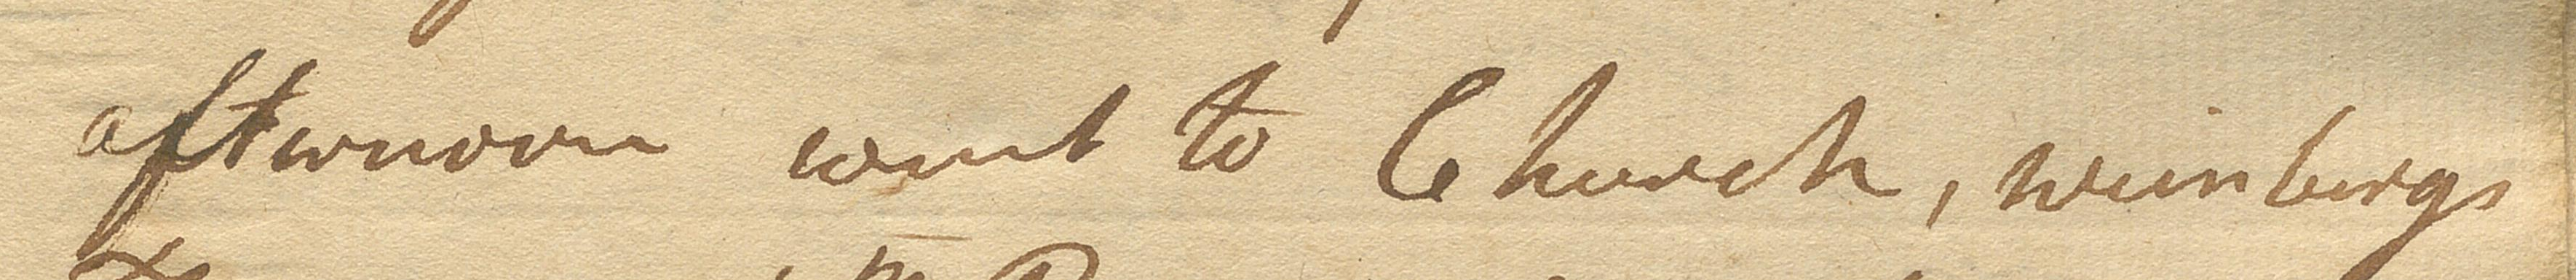afternoon went to Church, weinbergs
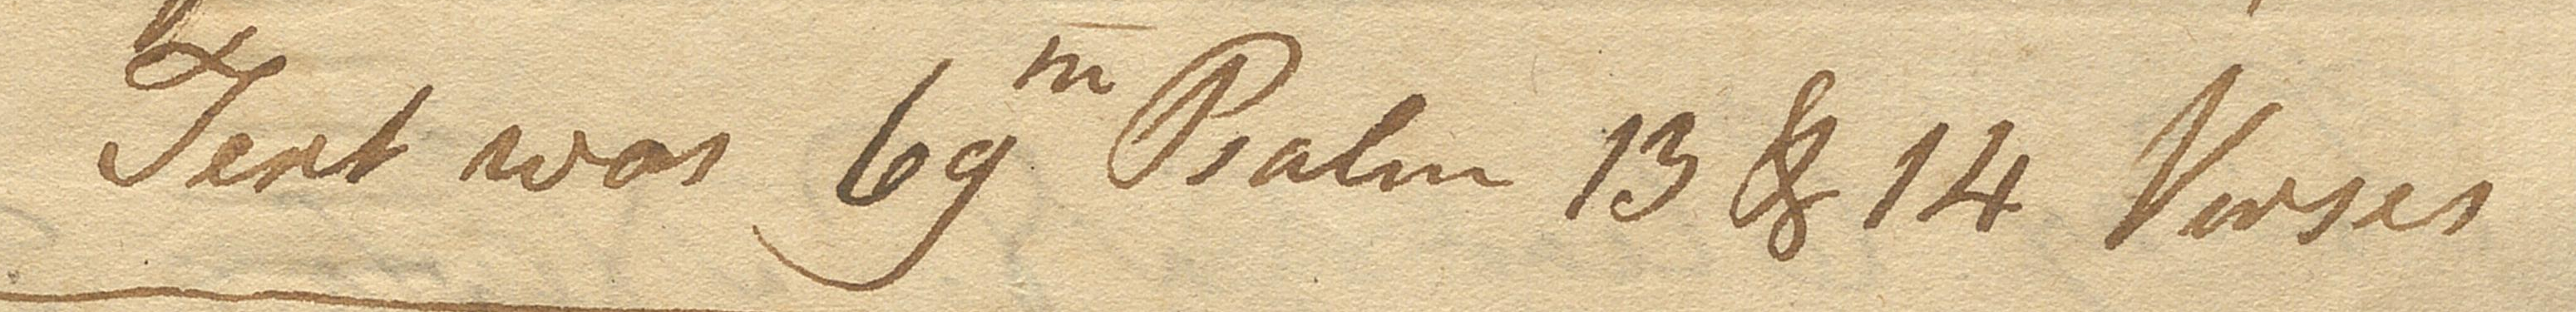Text was 69^t. Psalm 13 & 14 Verses
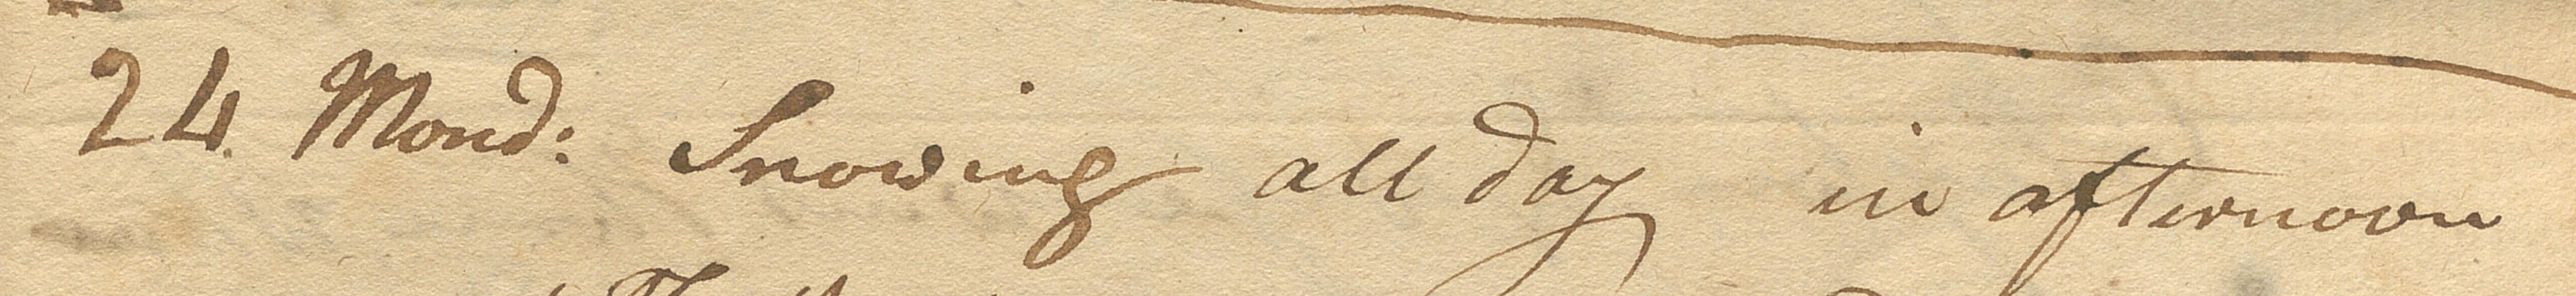24 Mond: Snowing all day in afternoon
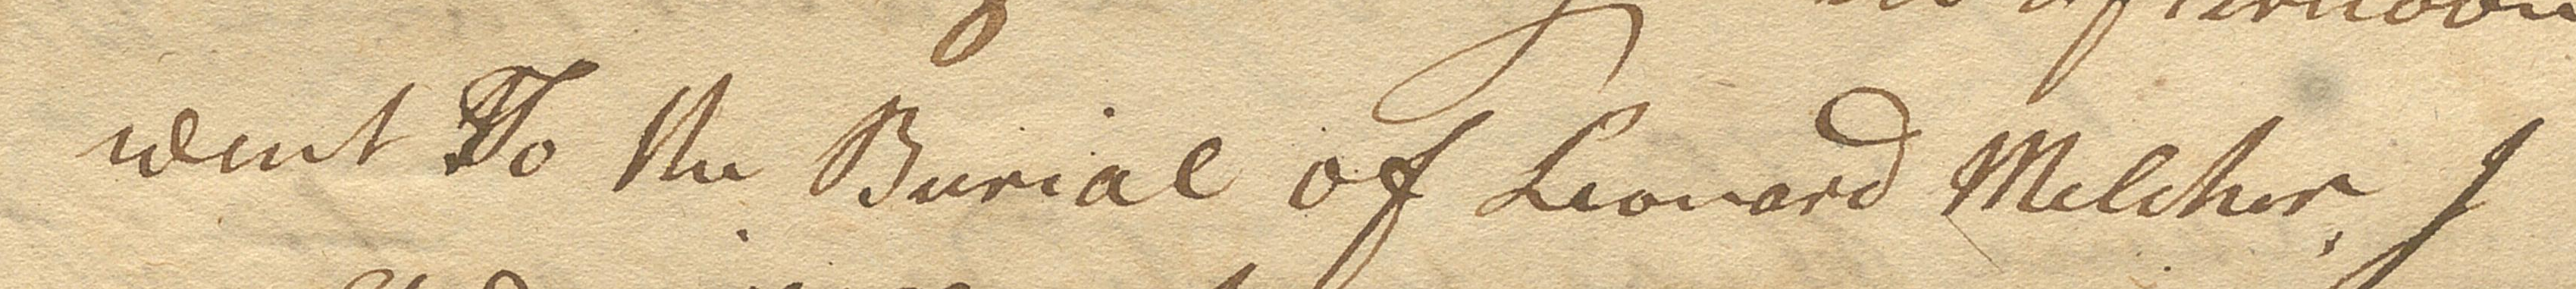went to the Burial of Leonard Melcher, I
